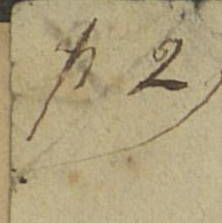p. 2
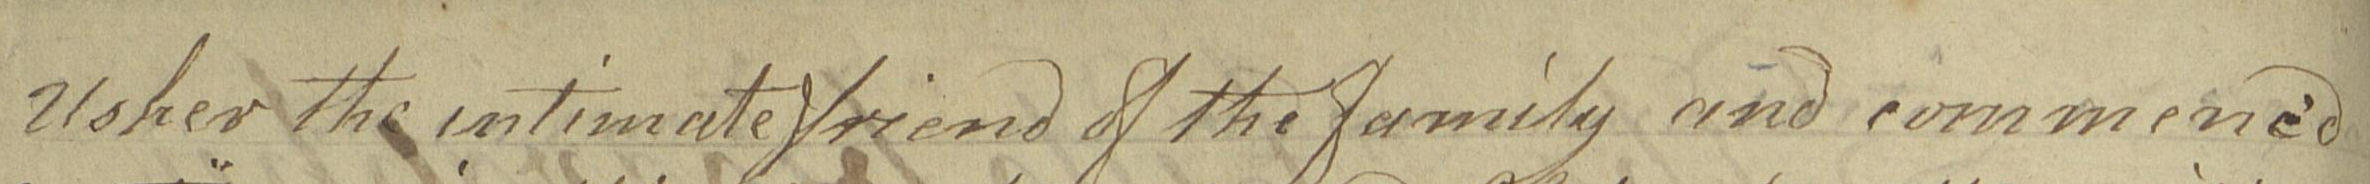Usher the intimate friend of the family and commenc'd
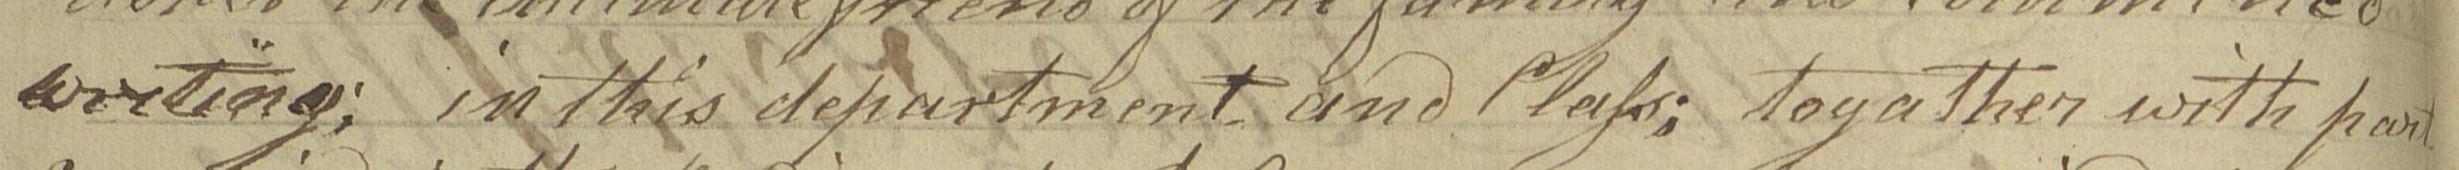writing; in this department and Class; togather with part-
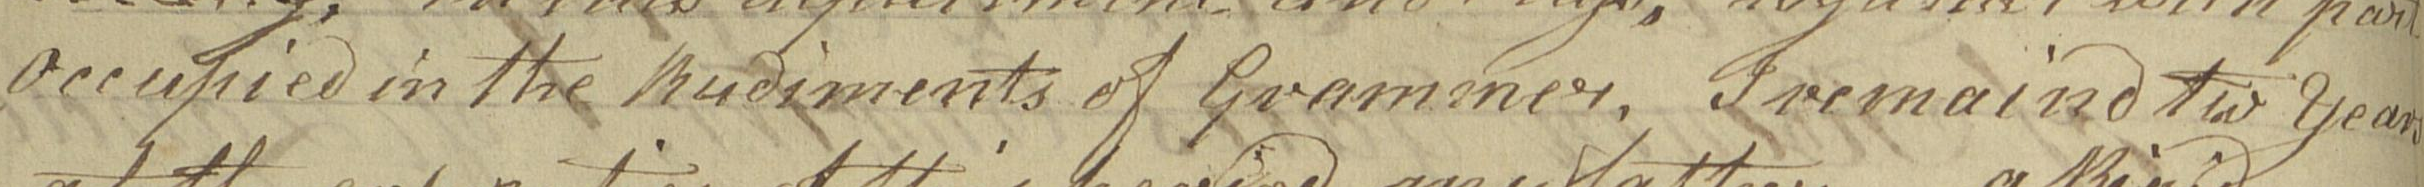occupied in the Rudiments of Grammer. I remained tw years
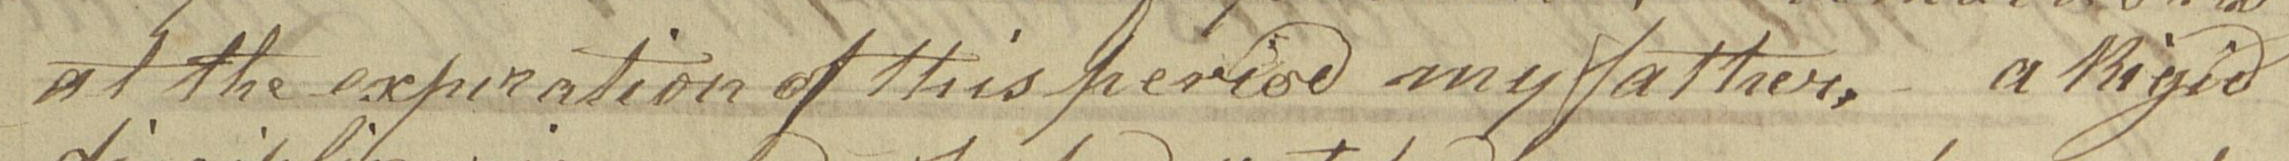at the expiration of this period my father, a Rigid
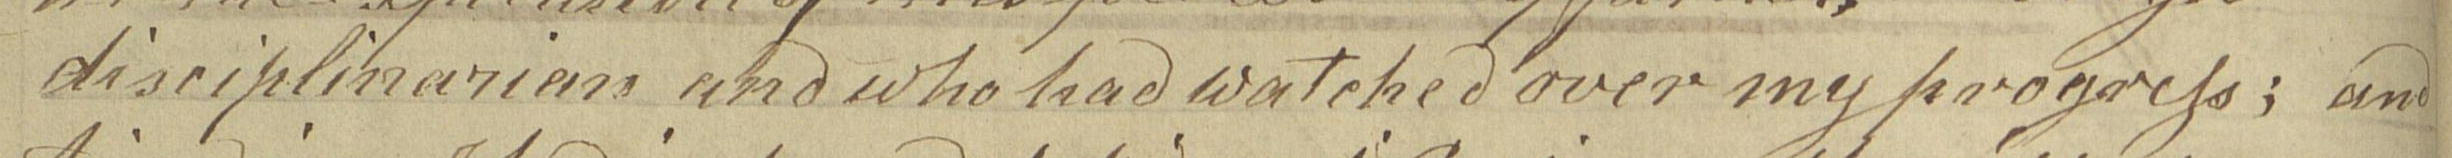disciplinarian and who had watched over my progress; and
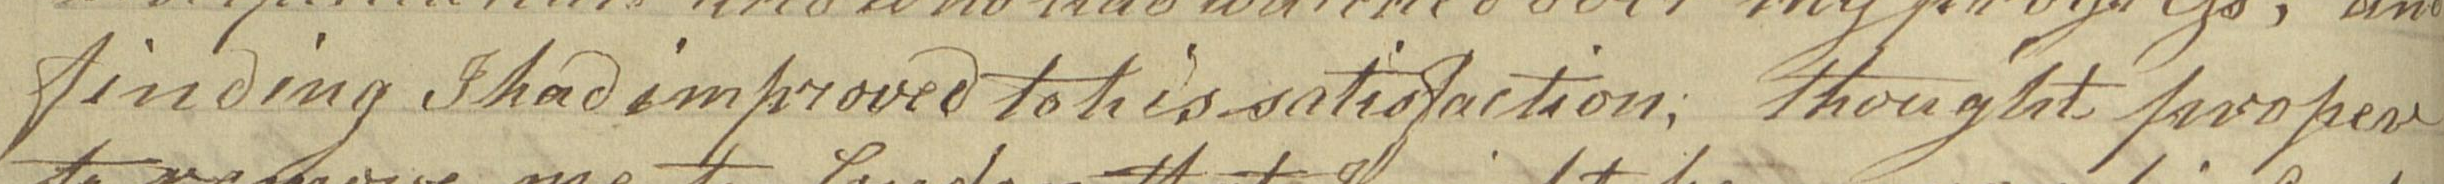finding I had improved to his satisfaction; thought proper
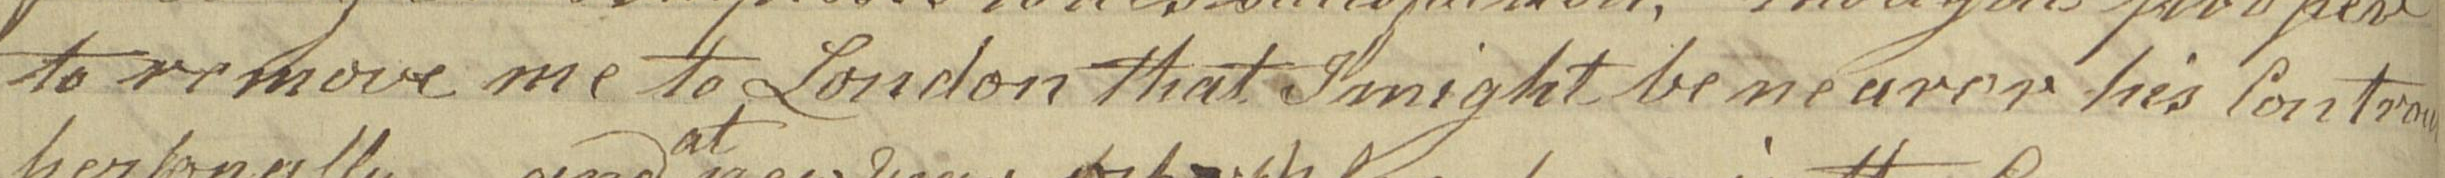to remove me to London that I might be nearer his Contra-
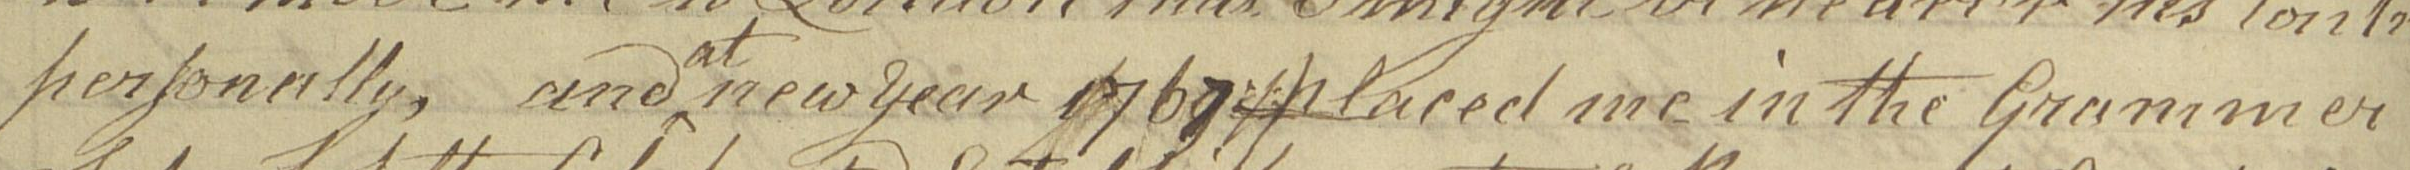personally, and ^ new year 1767 & placed me in the Grammer
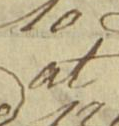at
